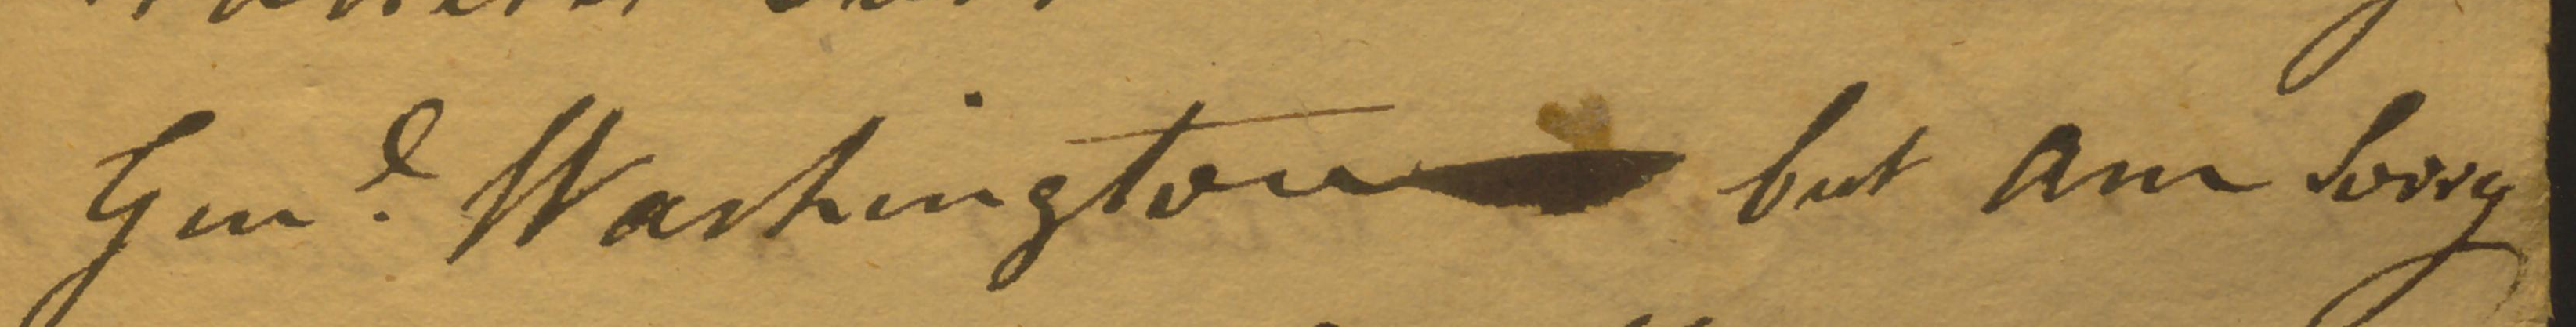Gen^l. Washington but am Sorry
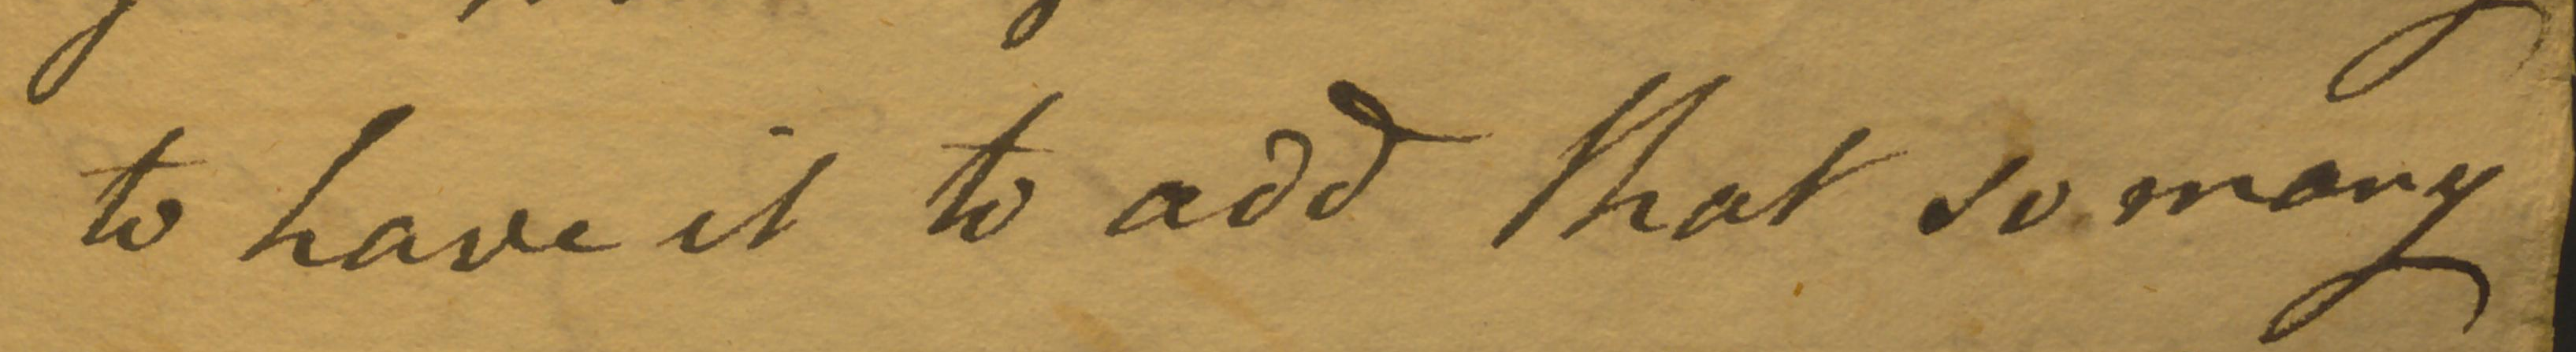to have it to add that so many
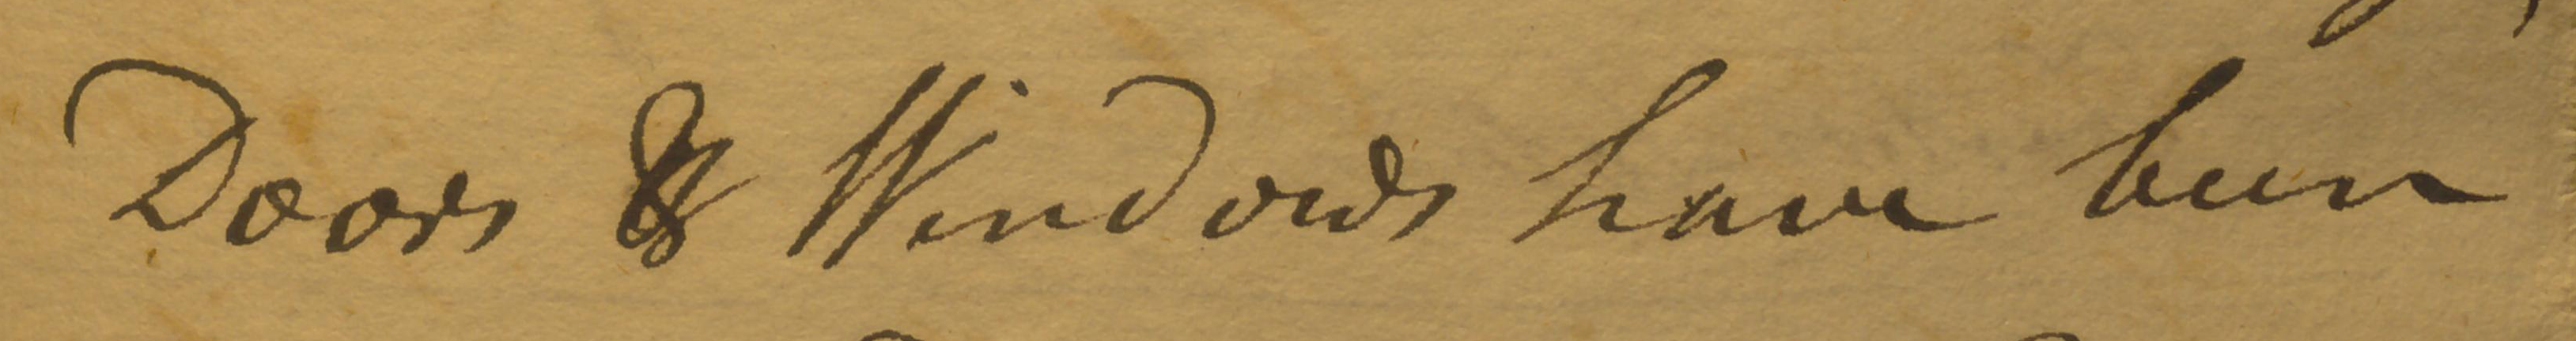Doors & Windows have been
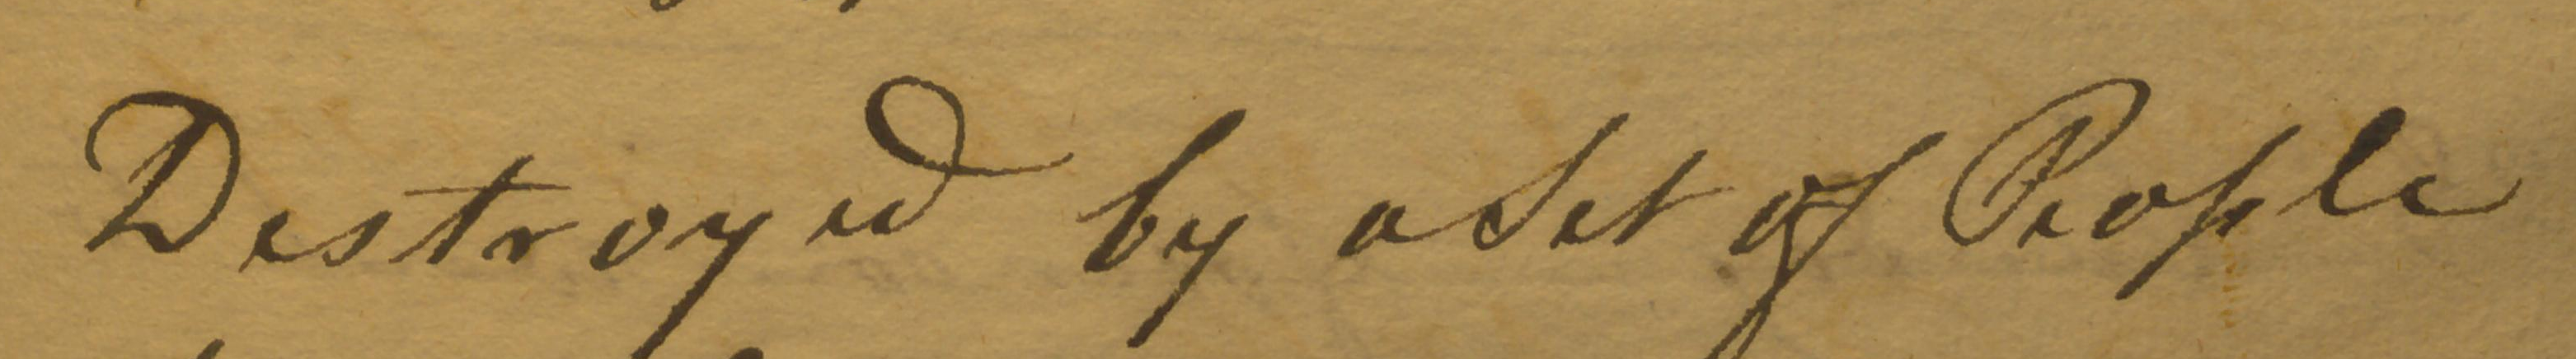Destroyed by a set of People
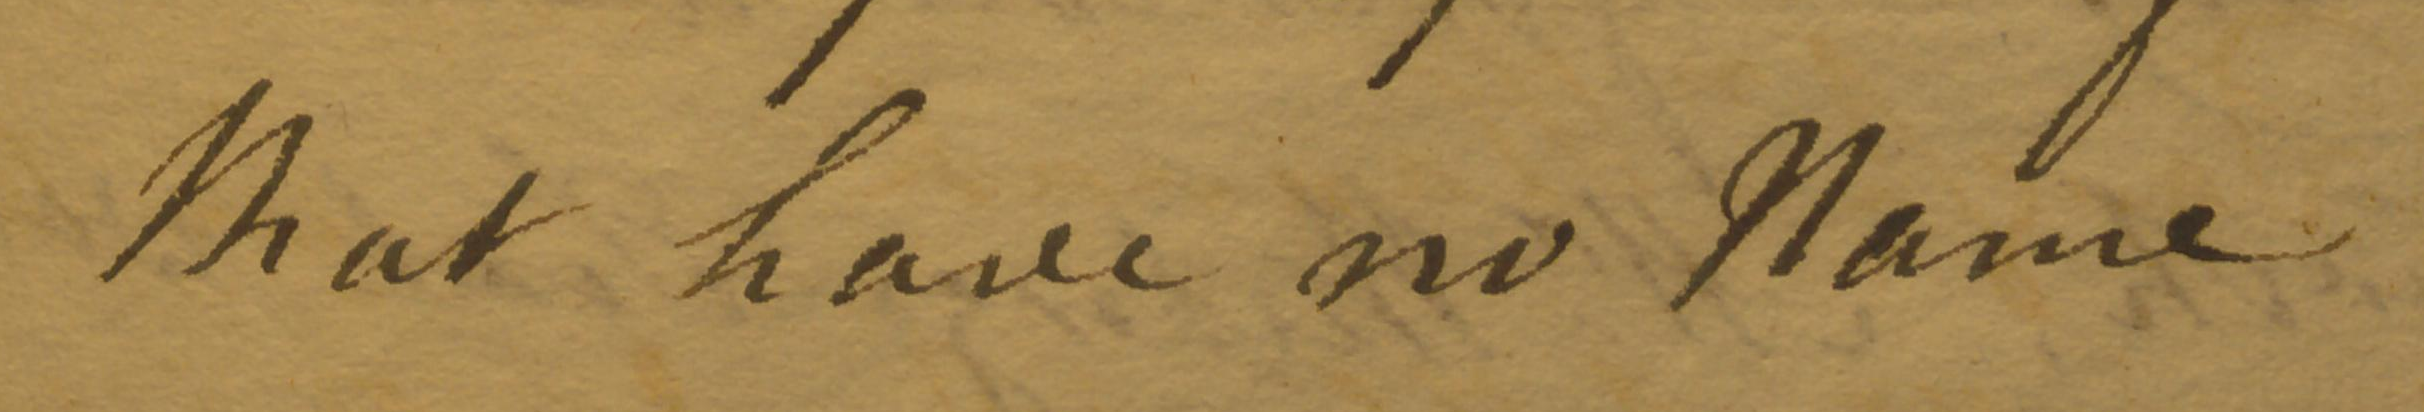that have no Name
